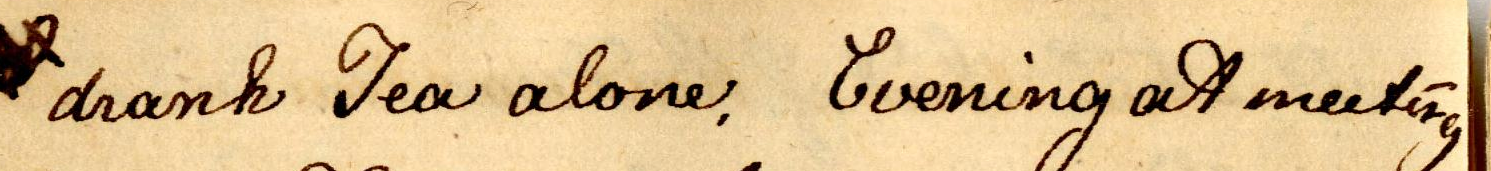drank Tea alone, Evening at meeting
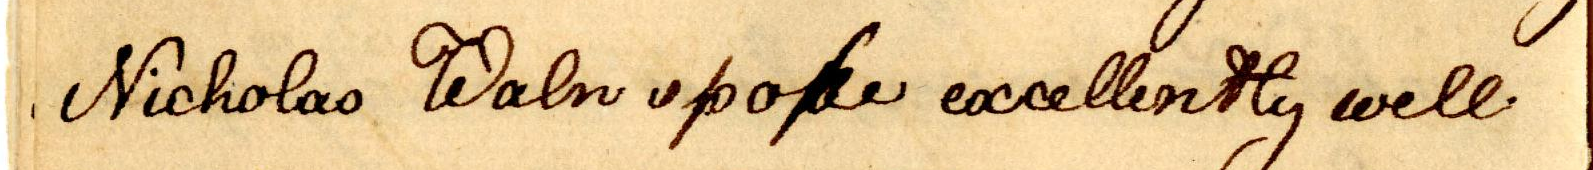Nicholas Waln spoke excellently well.
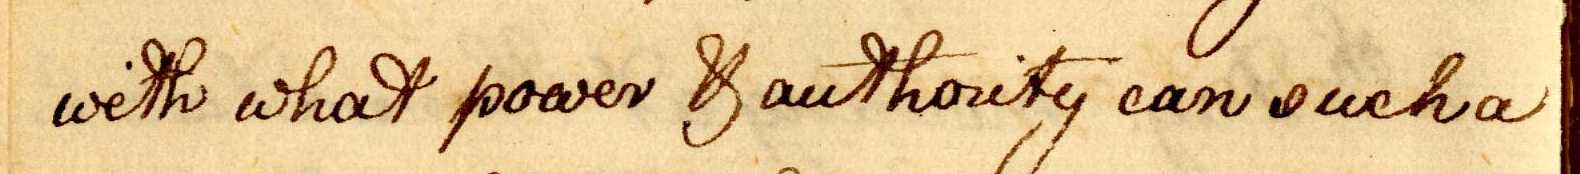with what power & authority can such a
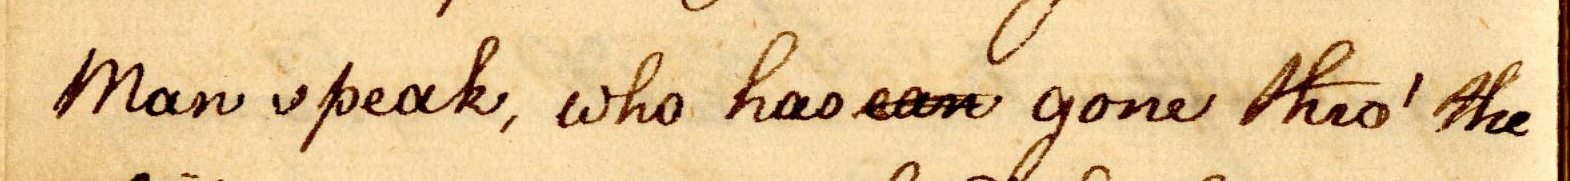Man speak, who has [can] gone thro' the
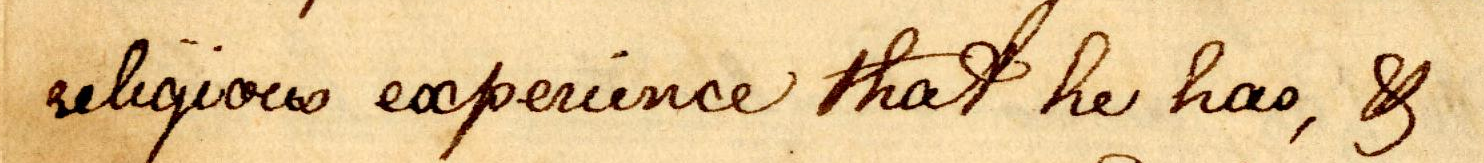religious experience that he has, &
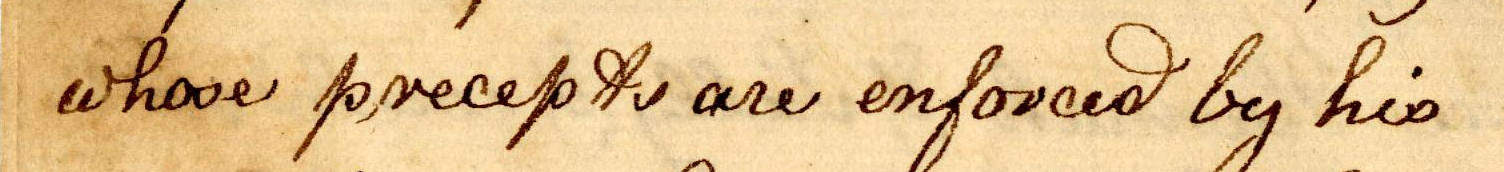whose precepts are enforced by his
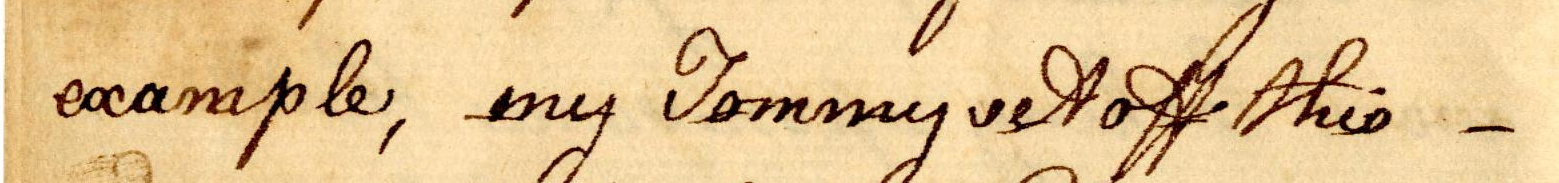example, my Tommy set off this-
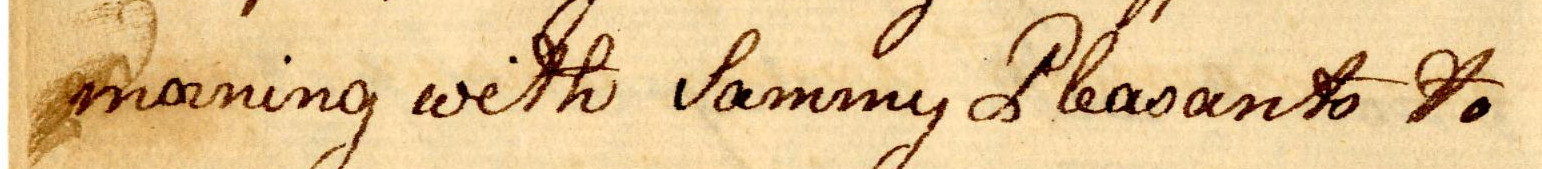morning with Sammy Pleasants to
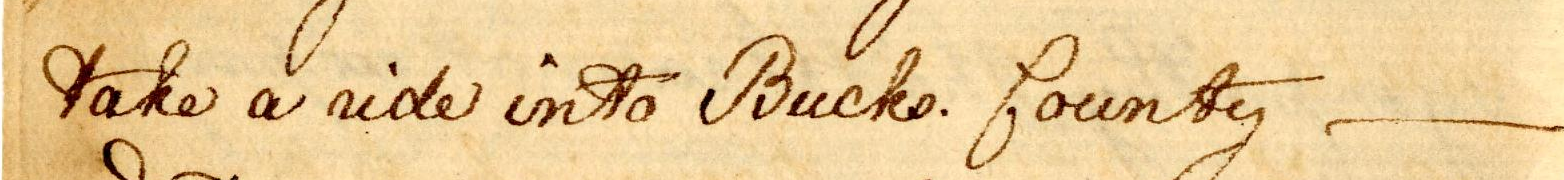take a ride into Bucks County-
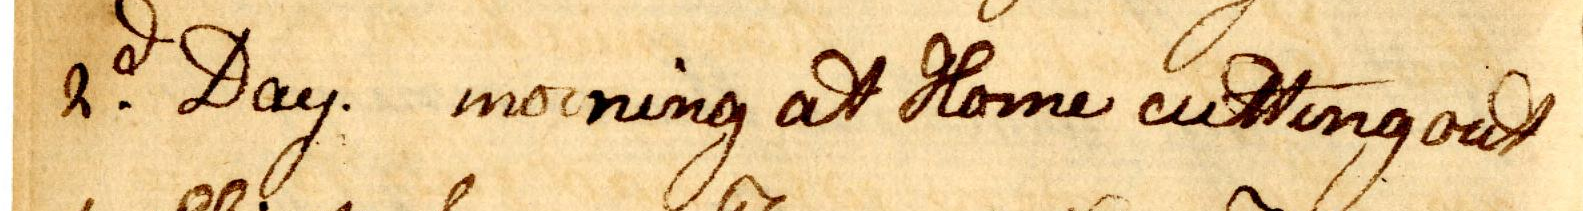2^d. Day. morning at Home cutting out
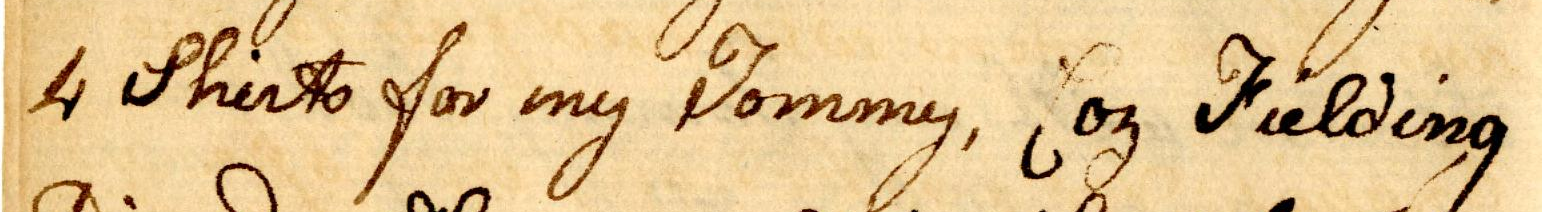4 Shirts for my Tommy, Coz Fielding
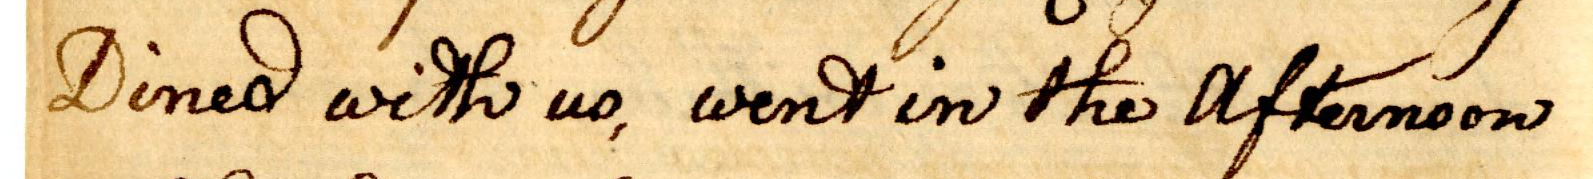Dined with us, went in the Afternoon
